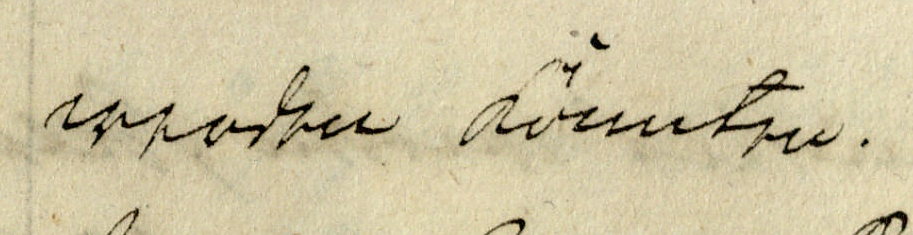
werden könnten.
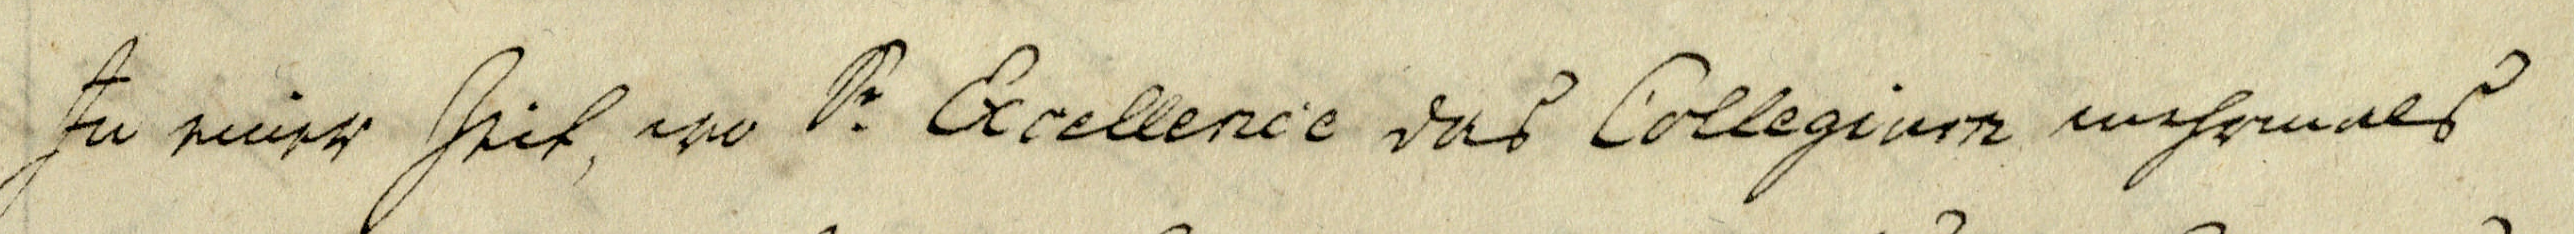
In einer Zeit, wo Sr Excellence das Collegium mehrmahls
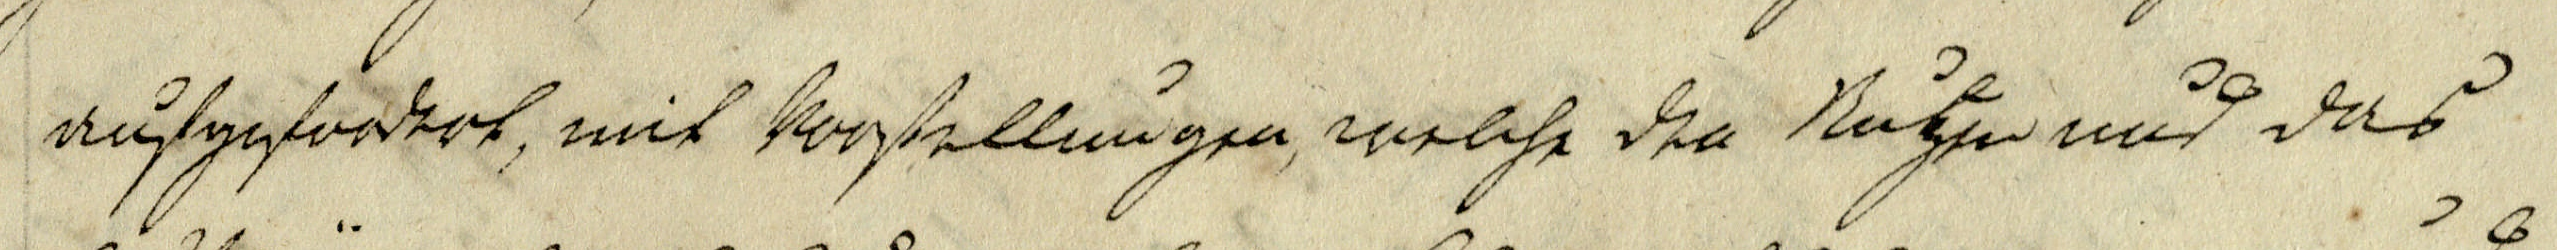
aufgefordert, mit Vorstellungen, welche den Nutzen und das
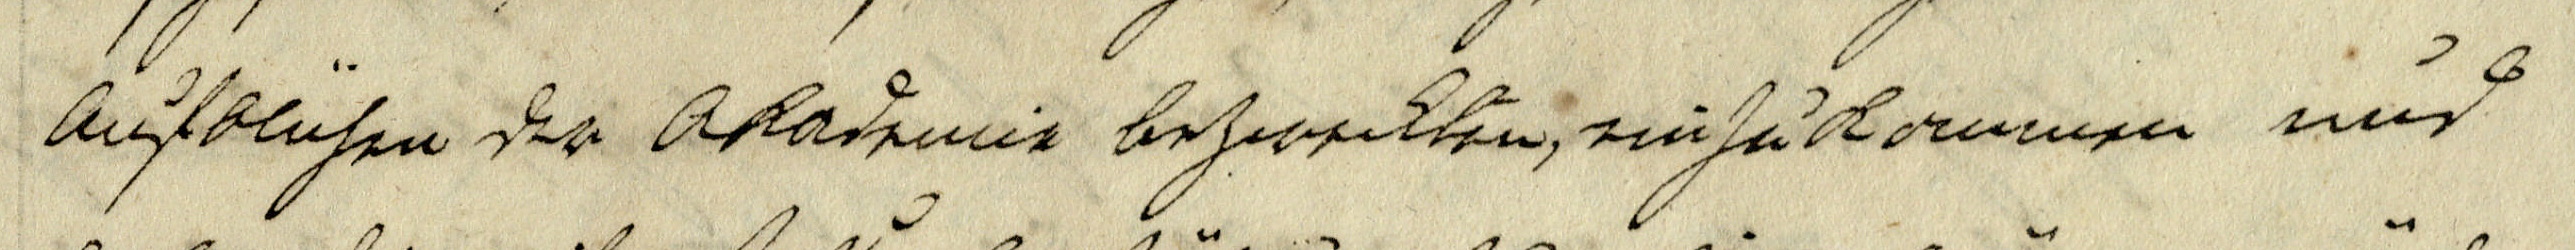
Aufblühen der Akademie bezweckten, einzukommen und
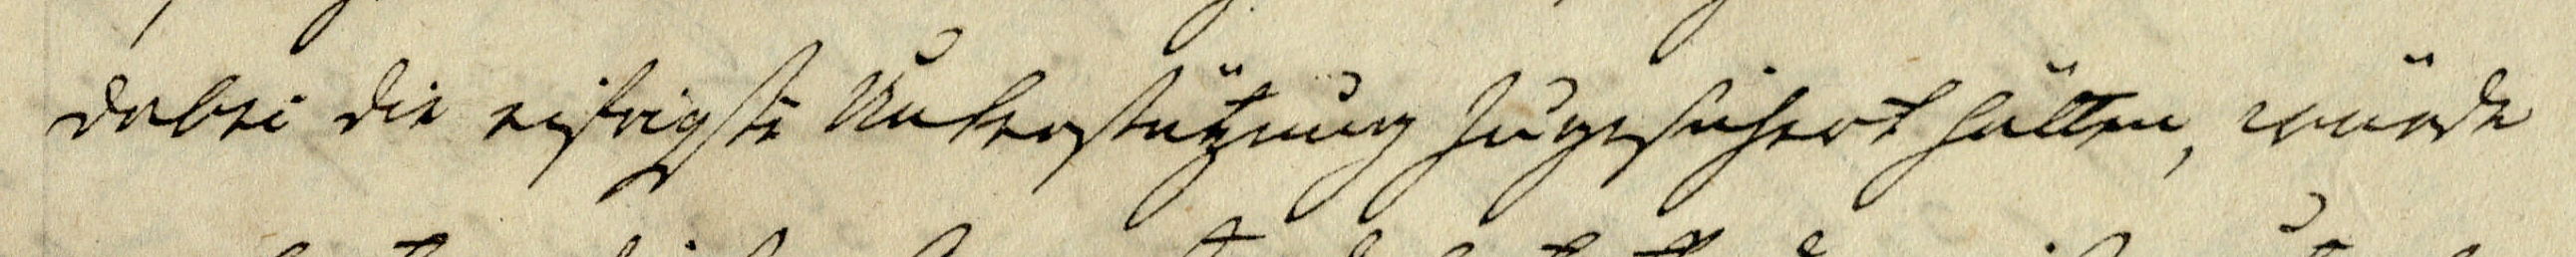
dabei die eifrigste Unterstützung zugesichert hätten, würde
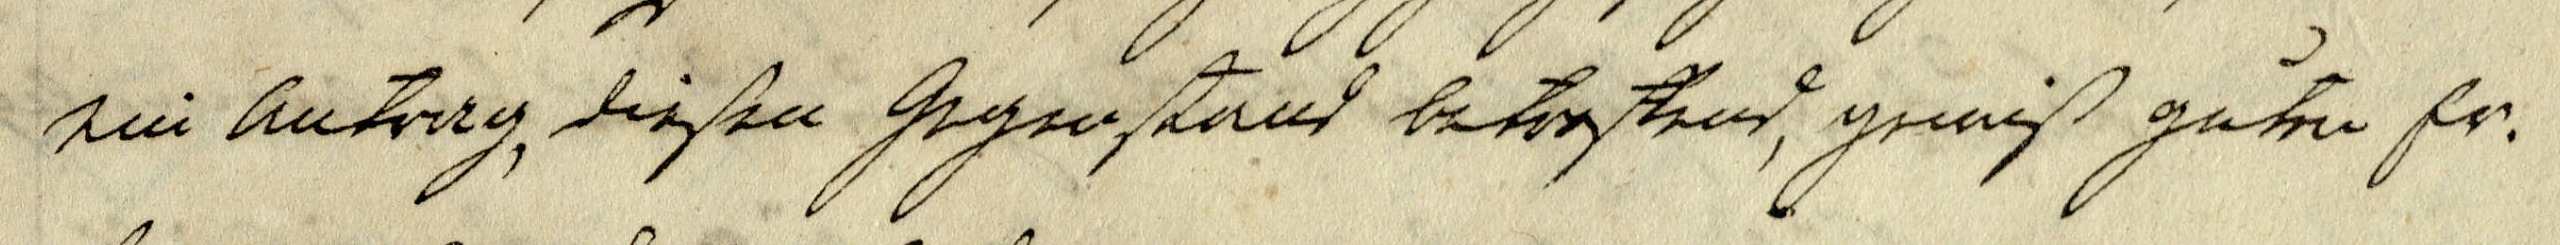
ein Antrag, diesen Gegenstand betreffend, gewiß guten Er¬
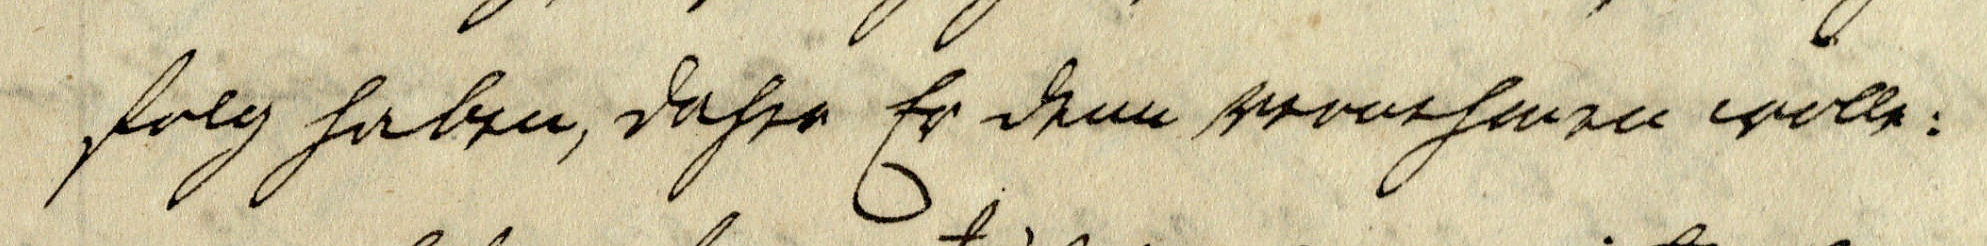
folg haben, daher Er denn vernehmen wolle:
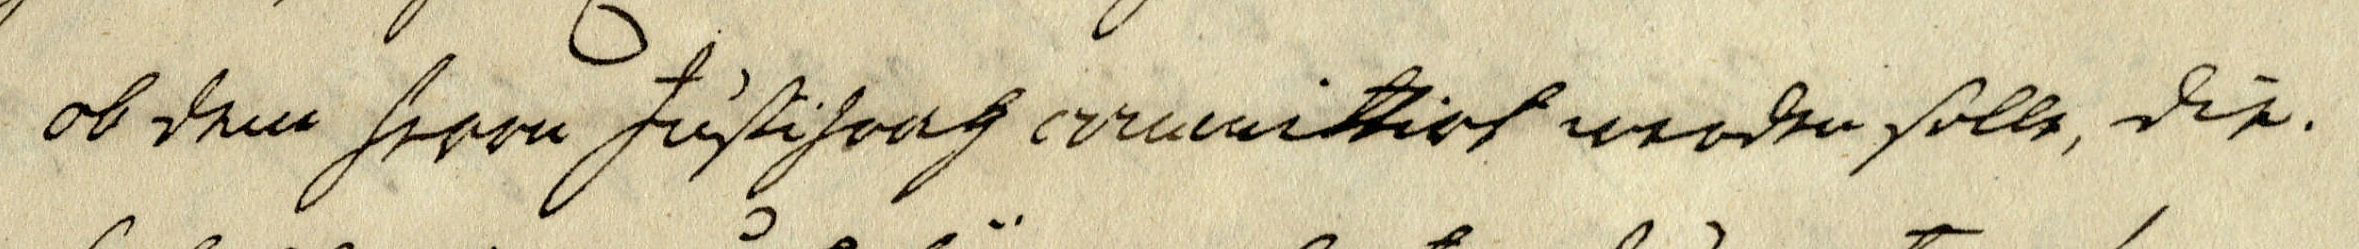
ob dem Herrn Justizrath committirt werden solle, die¬
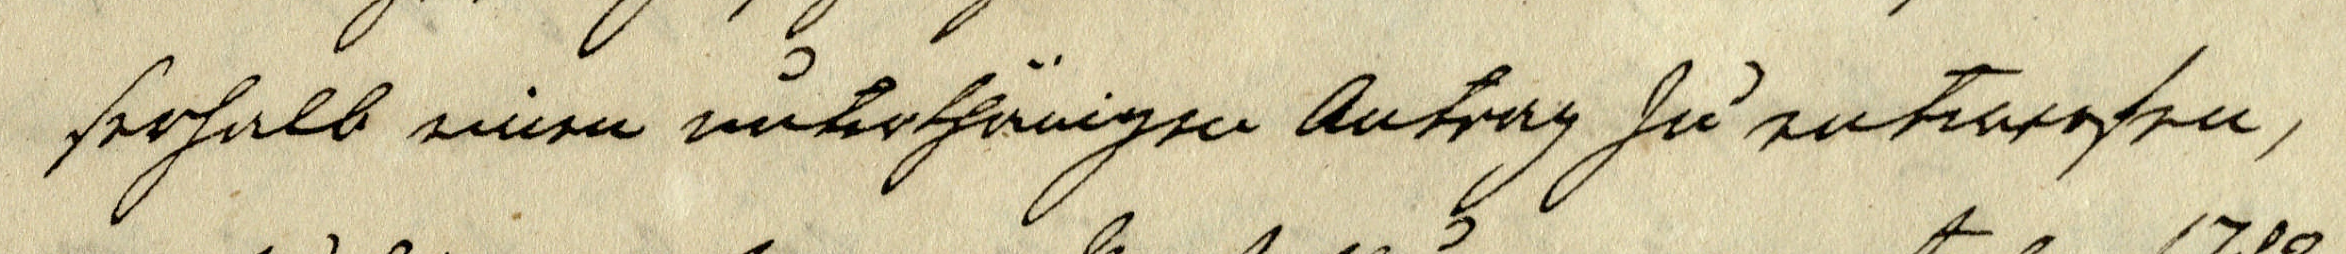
serhalb einen unterthänigen Antrag zu entwerfen,
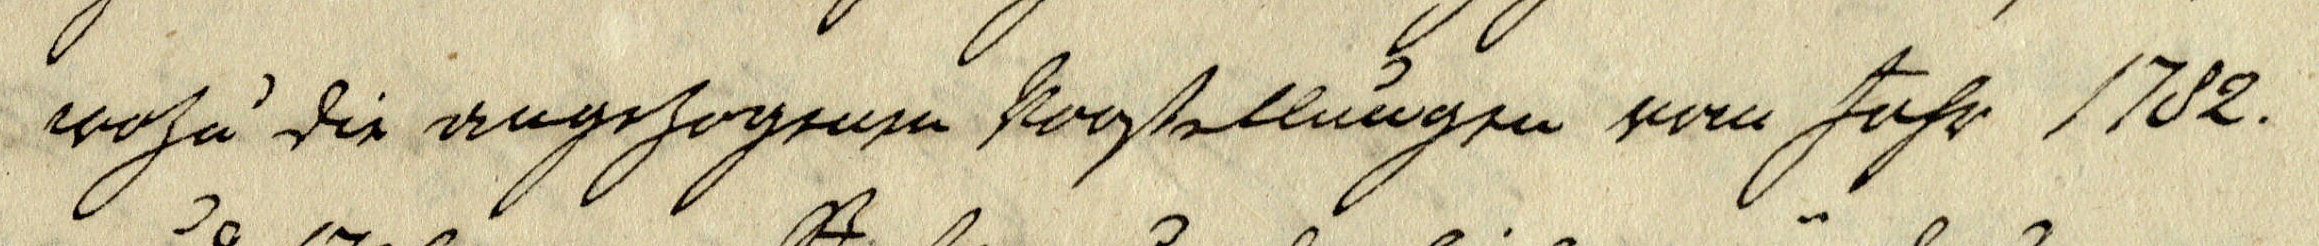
wozu die angezogenen Vorstellungen vom Jahr 1782.
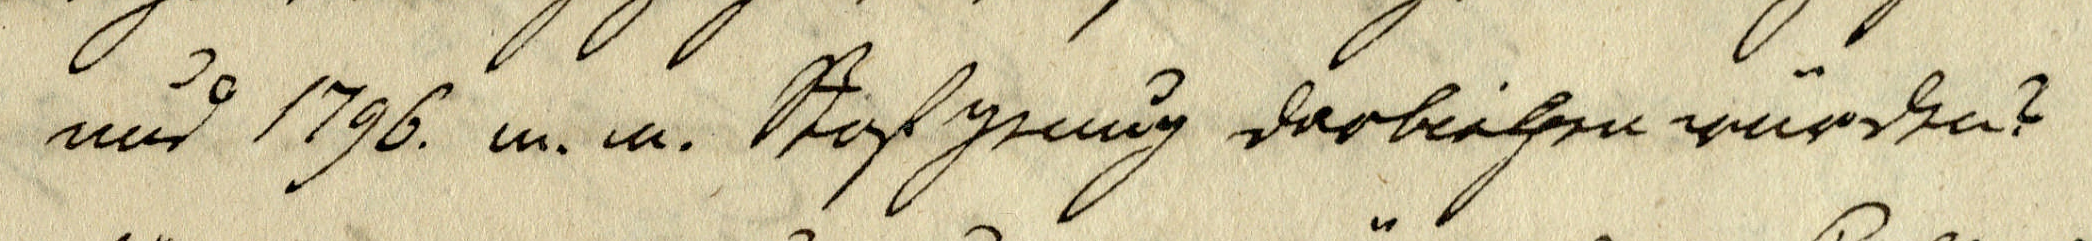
und 1796. m. m. Stof genug darbiethen würden?
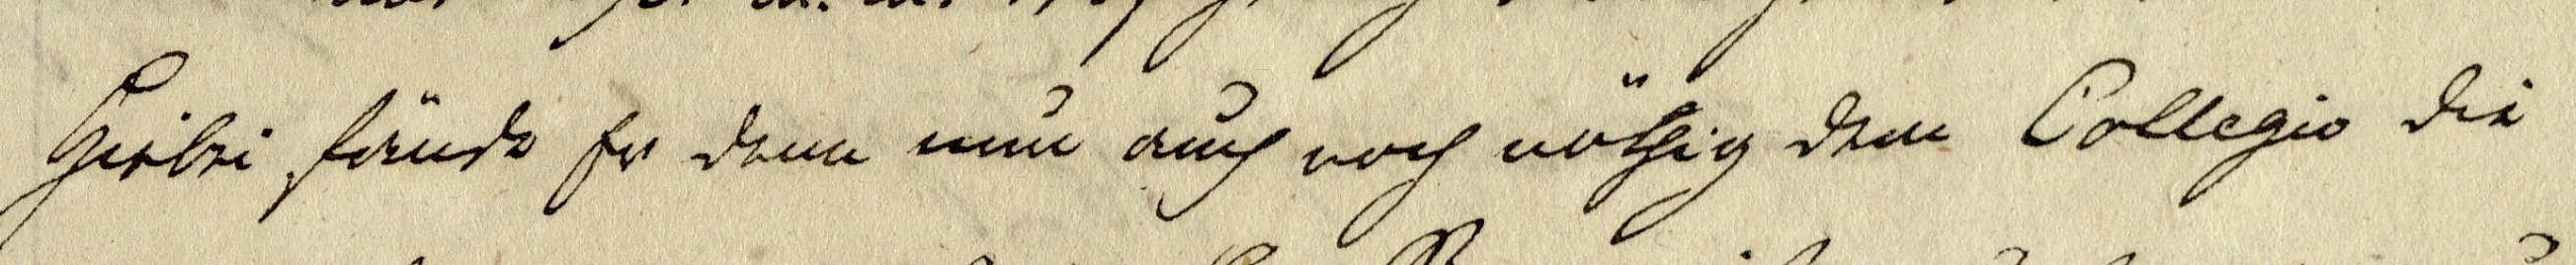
Hiebei fände Er denn nun auch noch nöthig dem Collegio die
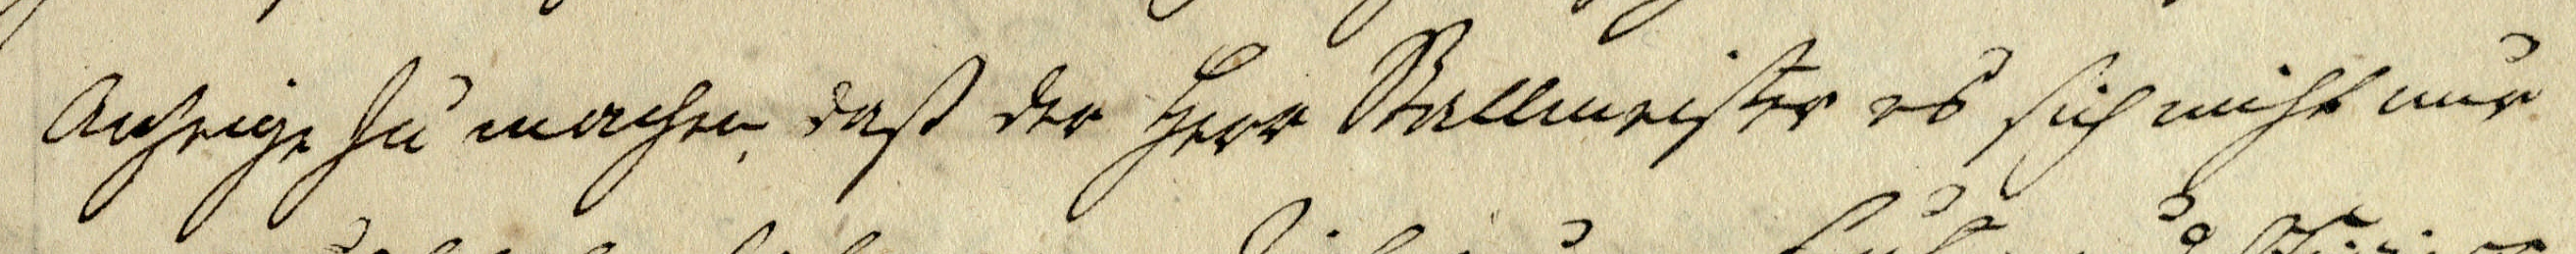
Anzeige zu machen, daß der Herr Stallmeister es sich nicht nur
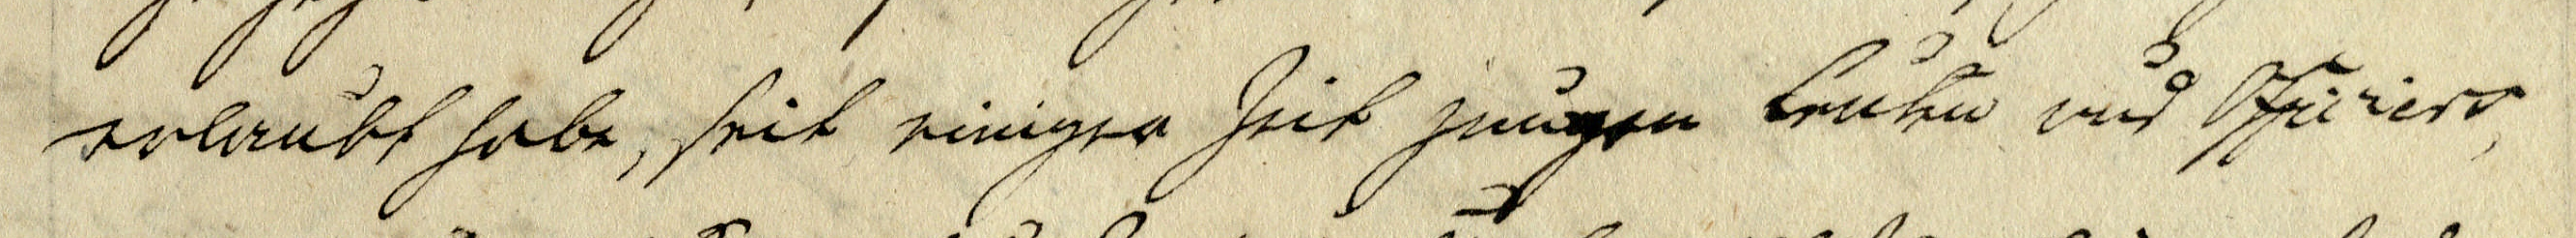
erlaubt habe, seit einiger Zeit jungen Leuten und Officiers,
